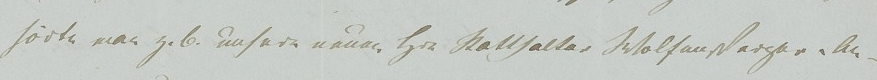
hörte man z. B. unsern neuen Hrn Statthalter Wolfensperger An-
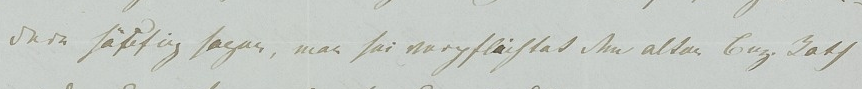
dern häufig sagen, man sei verpflichtet den alten Bez.Rath
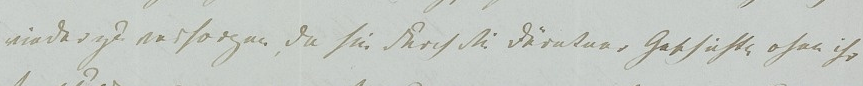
wieder zu versorgen, da sie durch die Dürntner Geschäfte ohne ihr
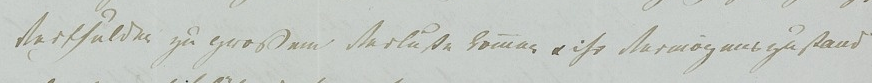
Verschulden zu großem Verluste kommen & ihr Vermögenszustand
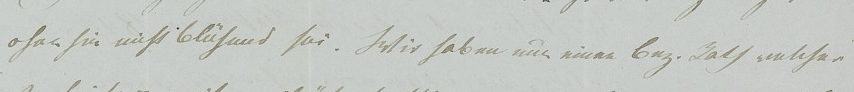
ohne hin nicht blühend sei. Wir haben nun einen Bez.Rath welcher
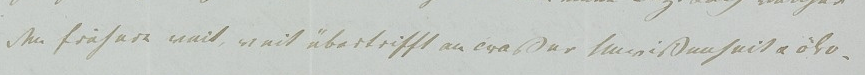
den frühern weit, weit übertrifft an craßer Unwißenheit & öko-
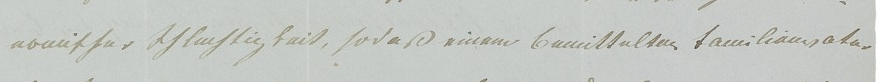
nomischer Schlechtigkeit, sodaß einem bemittelten Familienvater
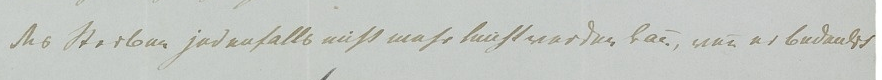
das Sterben jedenfalls nicht mehr leicht werden kann, wenn er bedenkt
